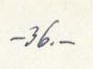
36
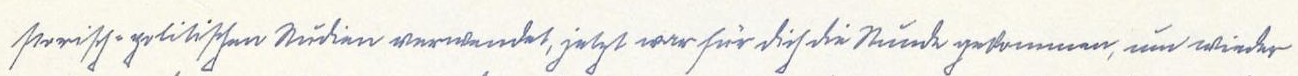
historisch-politischen Studien verwendet, jetzt war für dich die Stunde gekommen, um wieder
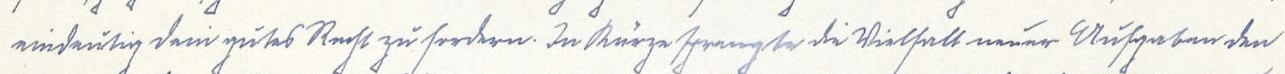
eindeutig dein gutes Recht zu fordern. In Kürze sprengte die Vielfalt neuer Aufgaben den
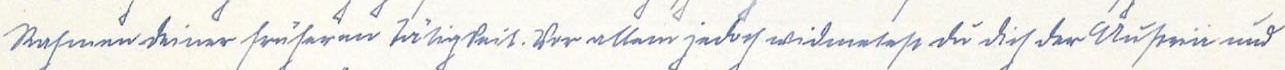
Rahmen seiner früheren Tätigkeit. Vor allem jedoch widmetest du dich der Austria und
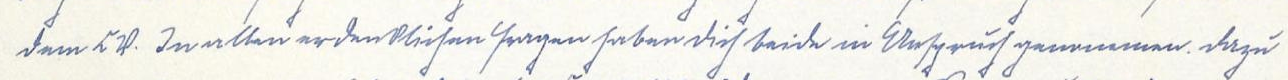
dem CV. In allen ordentlichen Fragen haben dich beide in Anspruch genommen. Dazu
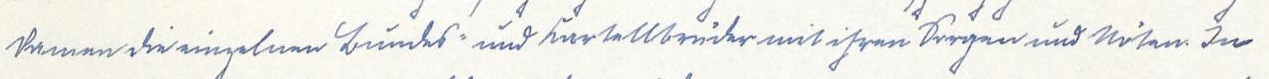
kamen die einzelnen Bundes- und Cartellbrüder mit ihren Sorgen und Nöten. In
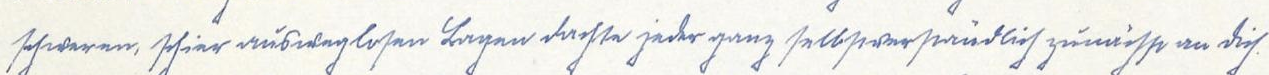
schweren, schier ausweglosen Lagen dachte jeder ganz selbstverständlich zunächst an dich.
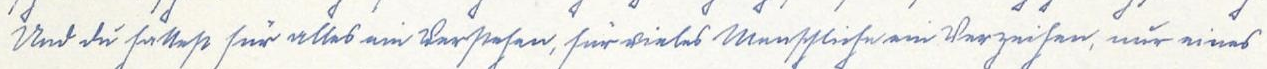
Und du hattest für alles ein Verstehen, für vieles Menschliche ein Verzeihen, nur eines
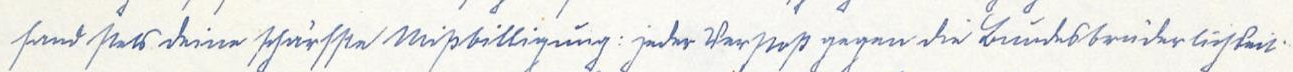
fand stets deine schärfste Missbilligung: jeder Verstoß gegen die Bundesbrüderlichkeit.
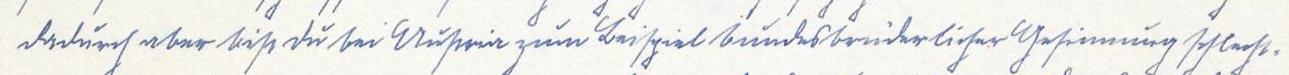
Dadurch aber bist du bei Austria zum Beispiel bundesbrüderlicher Gesinnung schlecht
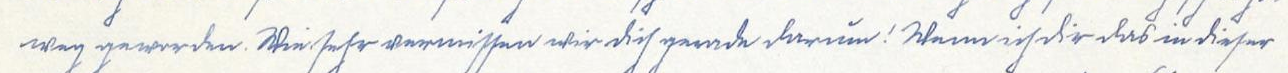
weg geworden. Wie sehr vermissen wir dich gerade darum. Wenn ich dir das in dieser
